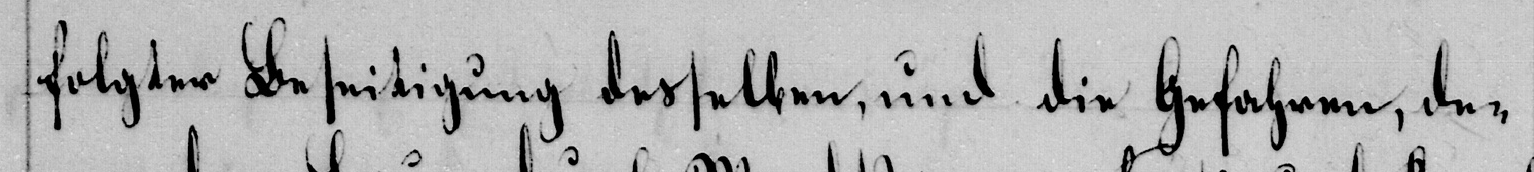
folgter Beseitigung desselben, und die Gefahren, de¬
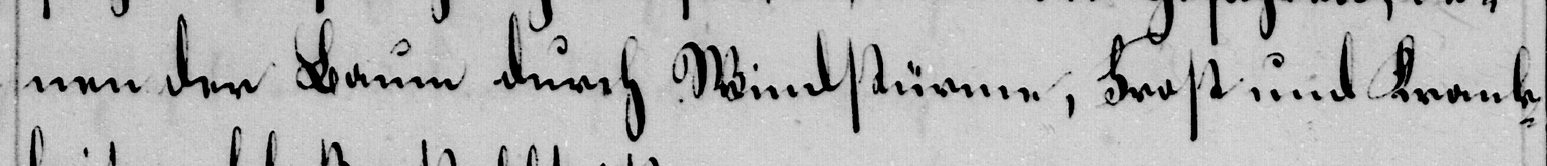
nen der Baum durch Windstürme, Frost und Krank¬
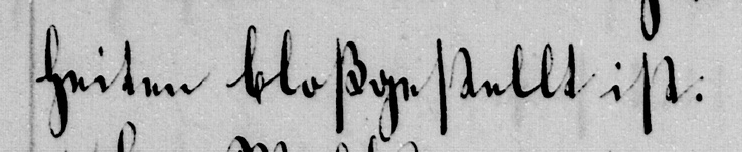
heiten bloßgestellt ist.
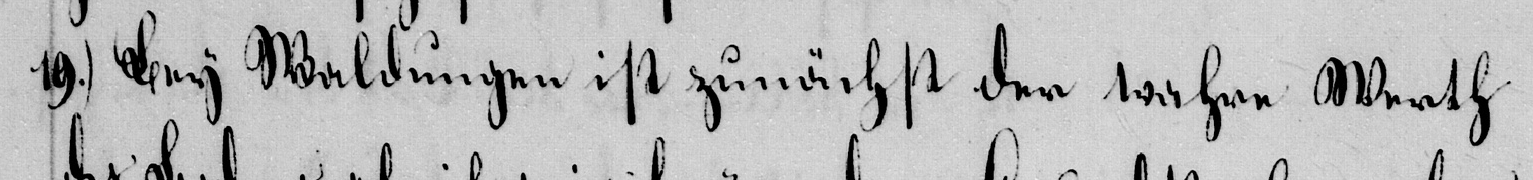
19.) Bey Waldungen ist zunächst der wahre Werth
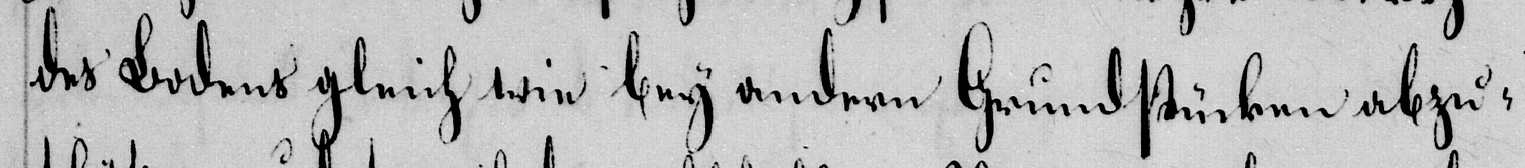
des Bodens gleich wie bey andern Grundstücken abzu¬
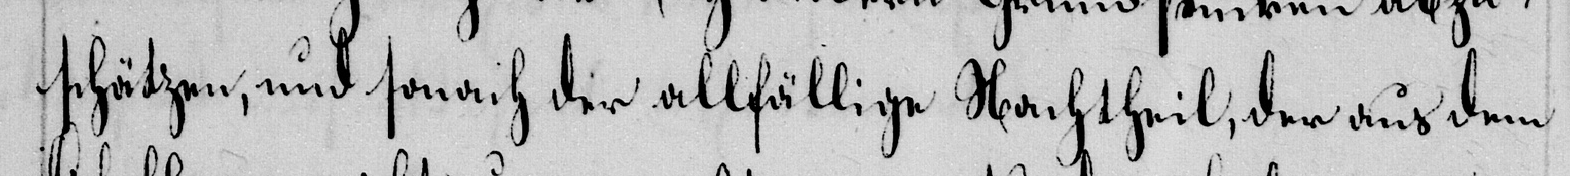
schätzen, und sonach der allfällige Nachtheil, der aus dem
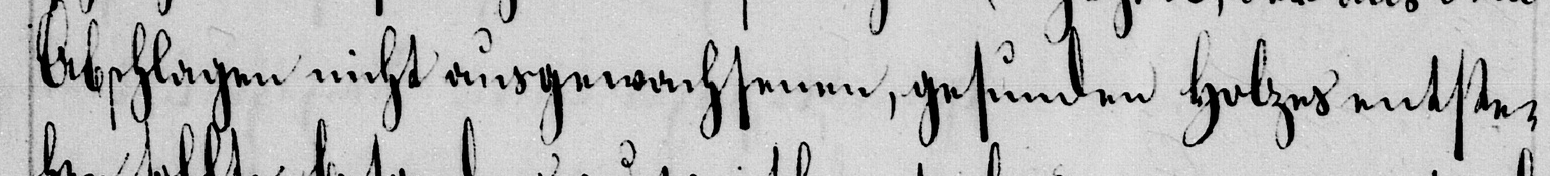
Abschlagen nicht ausgewachsenen, gesunden Holzes entste¬
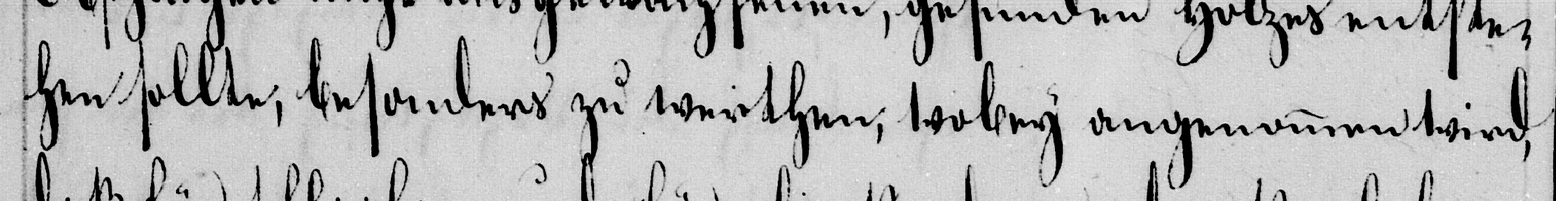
hen sollte; besonders zu werthen, wobey angenommen wird,
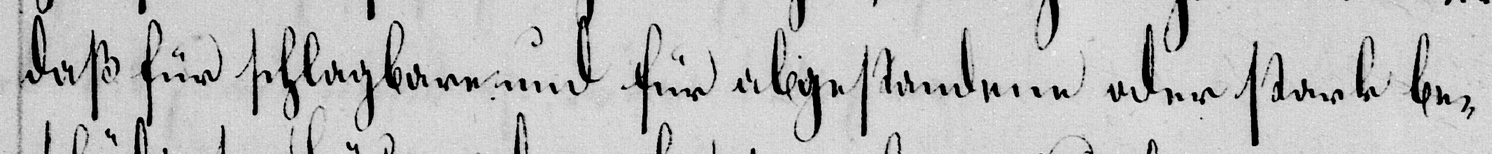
daß für schlagbare und für abgestandene oder stark be¬
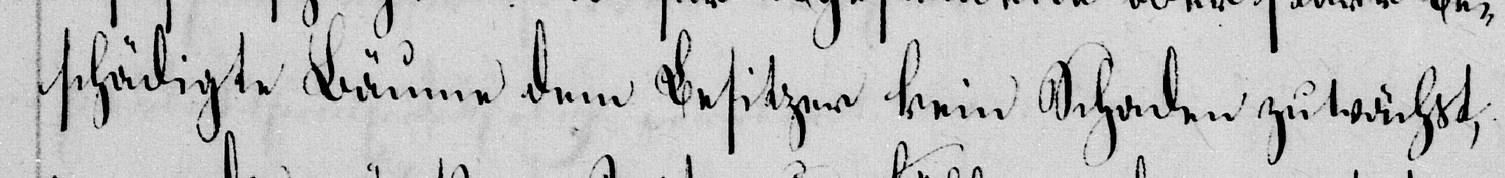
schädigte Bäume dem Besitzer kein Schaden zuwächst,
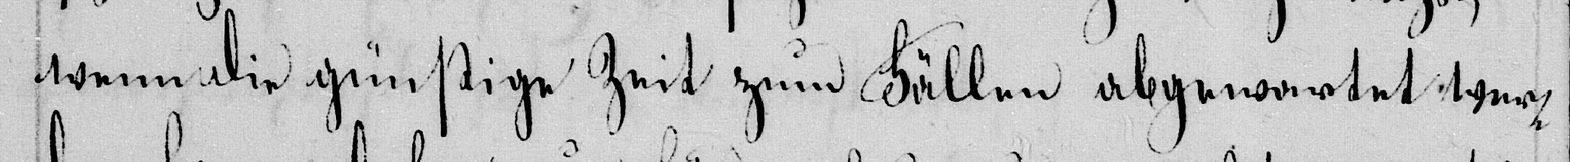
wenn die günstige Zeit zum Fällen abgewartet wer¬
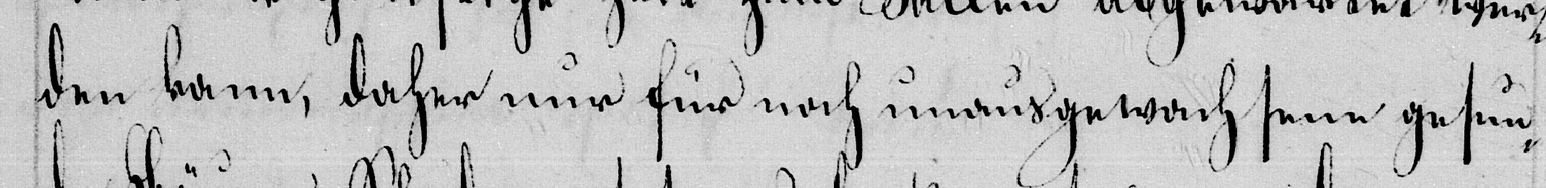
den kann, daher nur für noch unausgewachsene gesun¬
